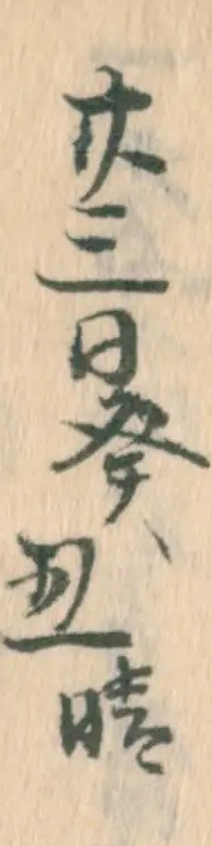廿三日癸丑晴
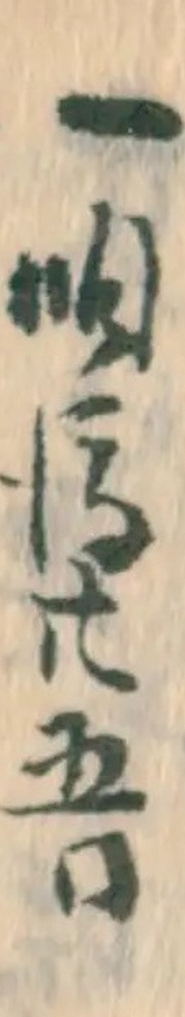一明後廿五日
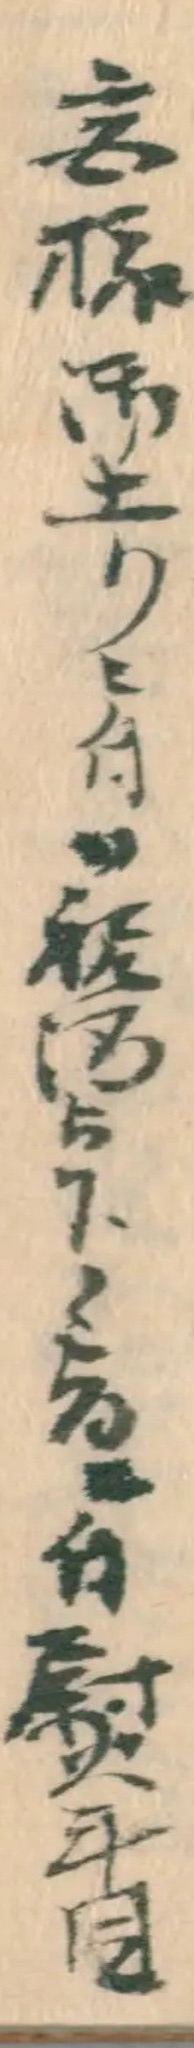宮様御上りニ付御祝酒被下候旨ニ付熨斗目
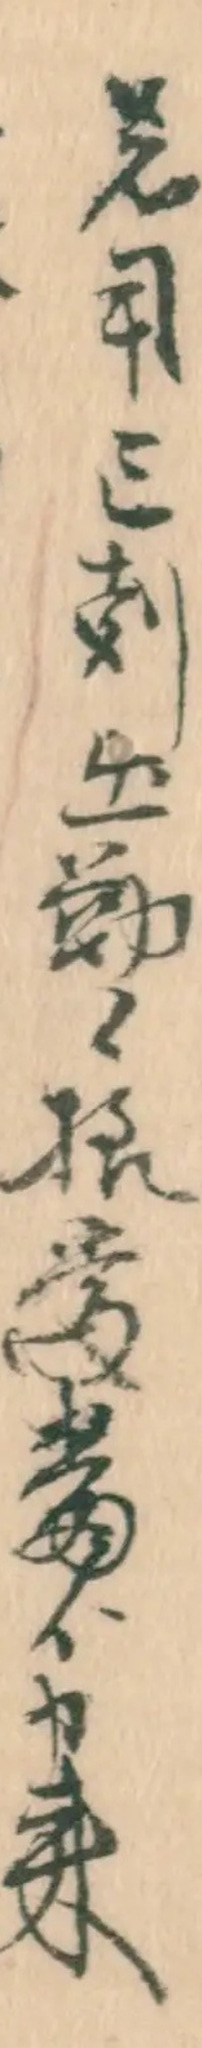着用巳刻出勤候様当番ゟ申来
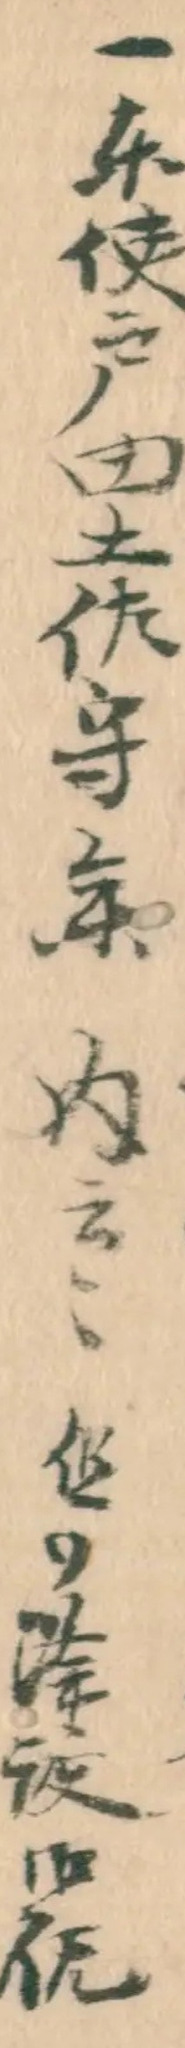一東使戸田土佐守参内云々但御降誕御祝
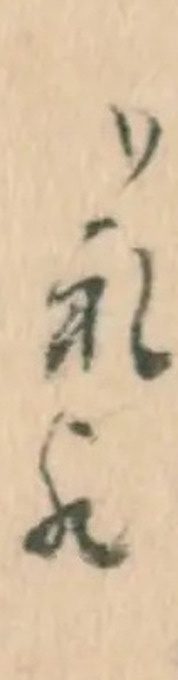御礼歟
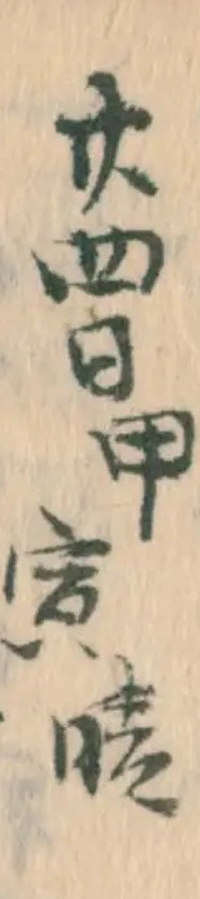廿四日甲寅晴
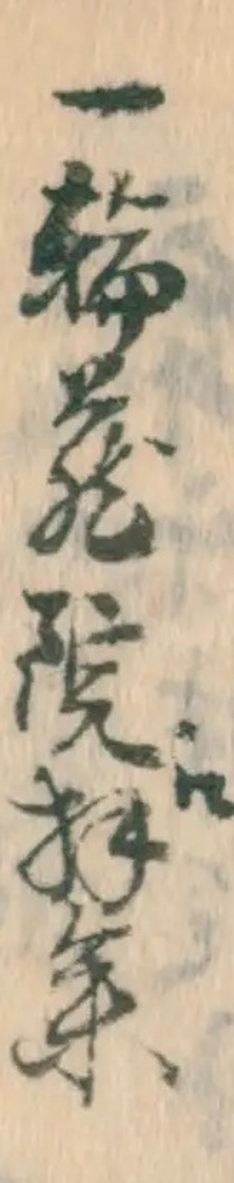一輪蔵院え拝参
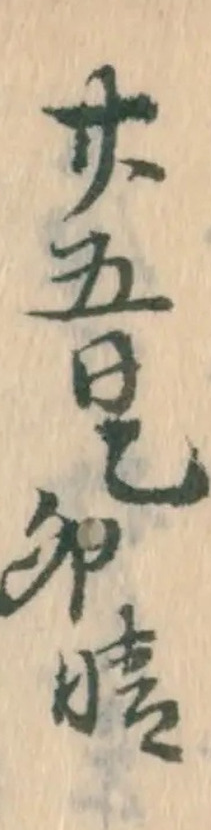廿五日乙卯晴
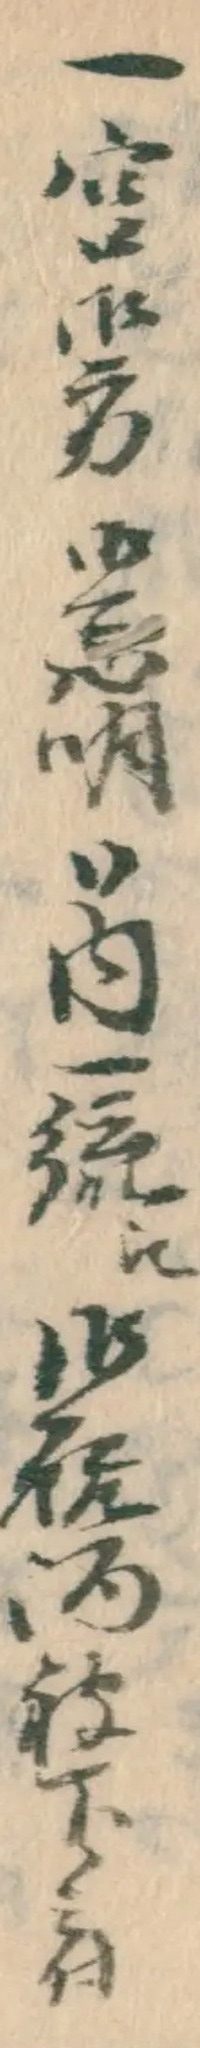一宮御方御忌明御内一統え御祝酒被下候ニ付
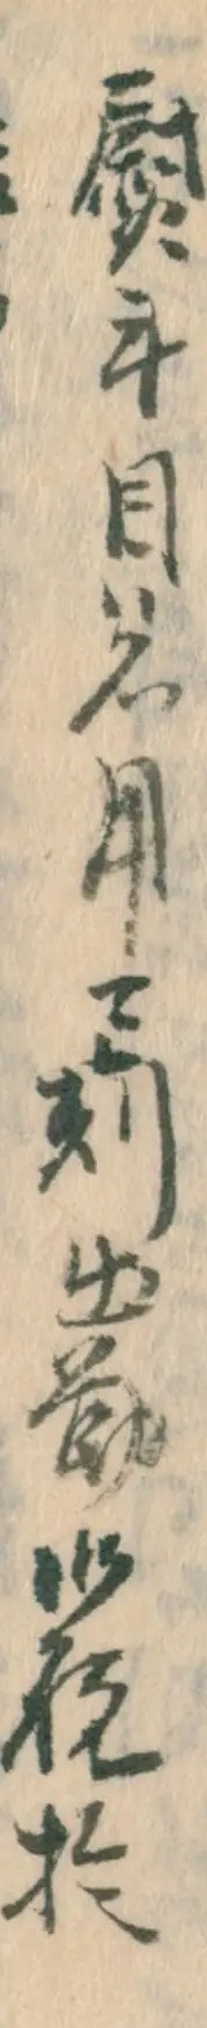熨斗目着用巳刻出勤御祝於
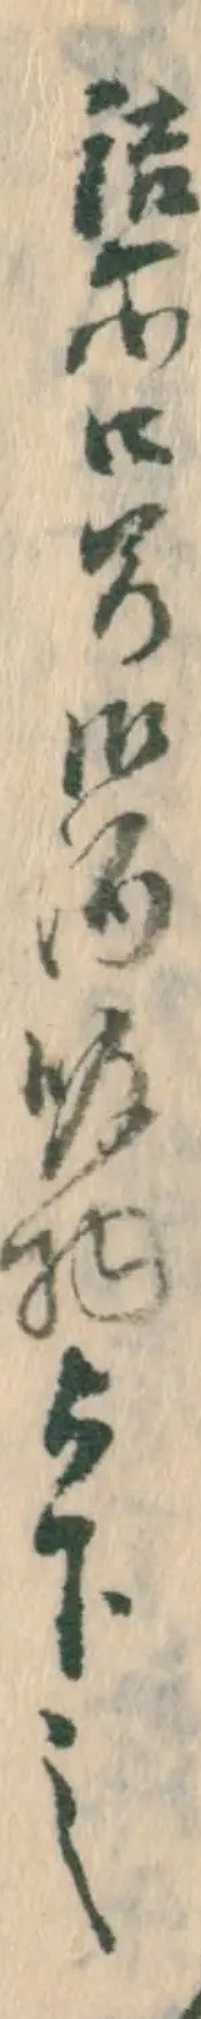詰所口間御酒吸物被下之
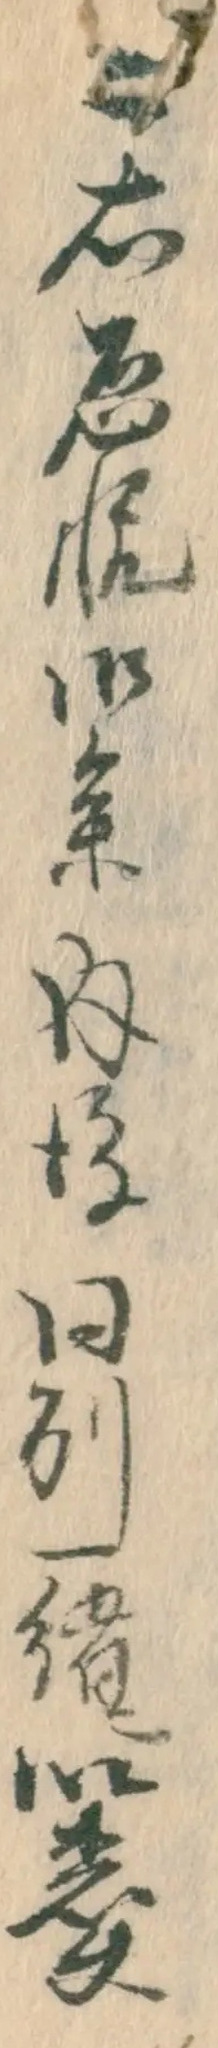一右恐悦御参内後同列一緒ニ御慶
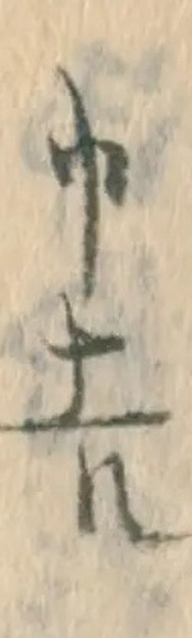申上ル

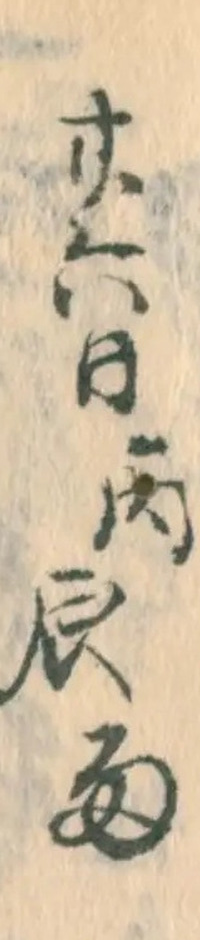廿六日丙辰雨
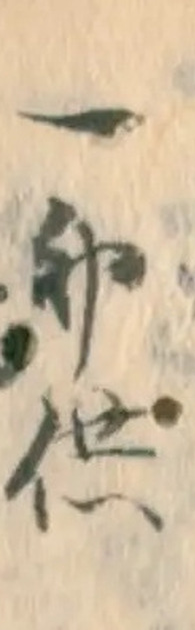一御供
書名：禁裏御所御用日記. [131]
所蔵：国立国会図書館 National Diet Library, JAPAN
